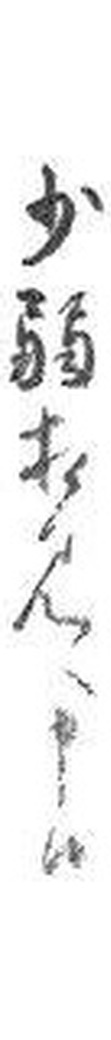少弱相見へ申候
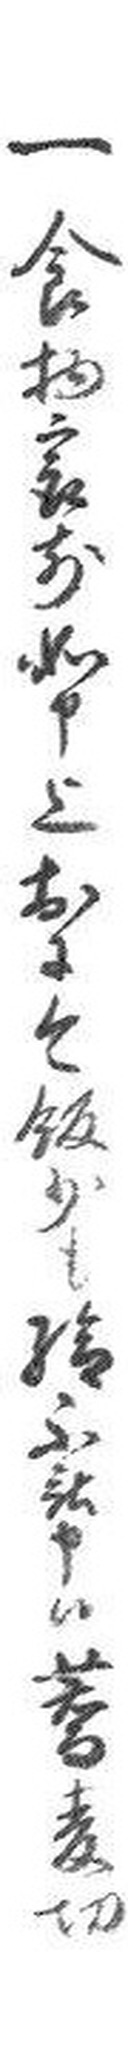一食物最前如申上およそ飯少も給不被申候蕎麦切
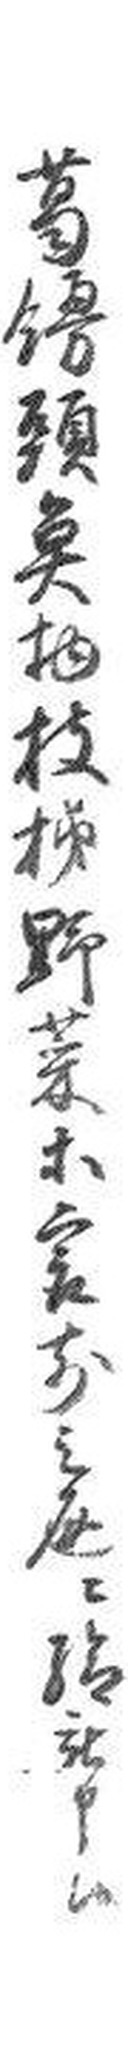葛饅頭魚物枝柿野菜等最前之通ニ給被申候
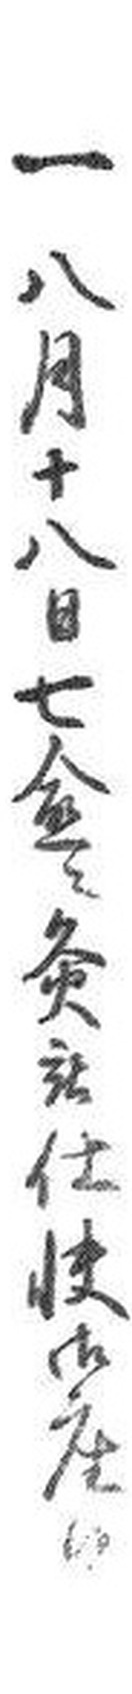一八月十八日七愈ニ灸被仕快御座候
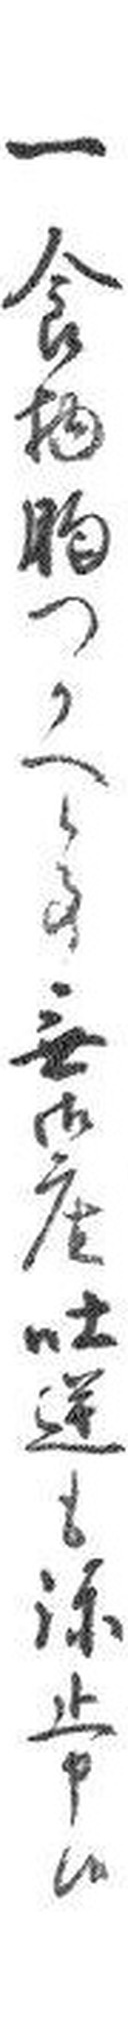一食物胸つかへ候事無御座吐逆も弥止申候
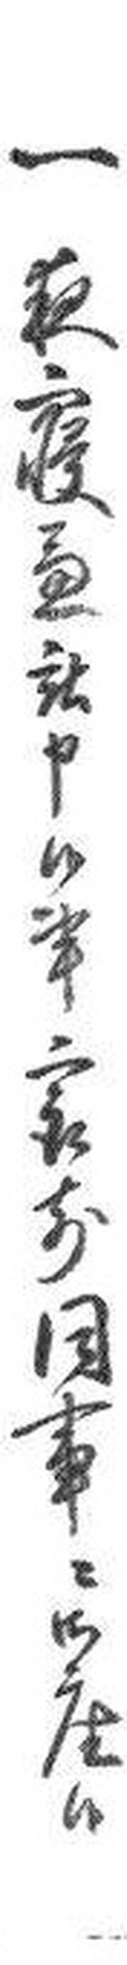一夜寝兼被申候事最前同事ニ御座候
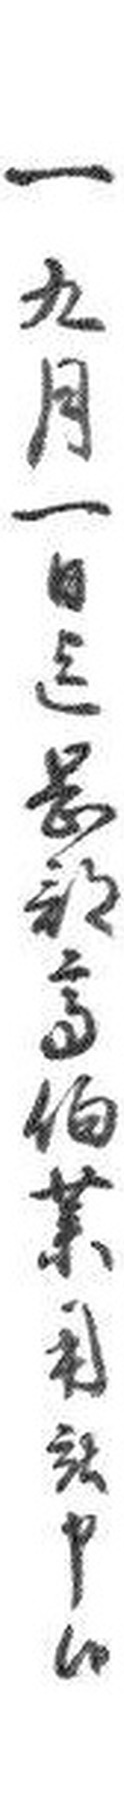一九月一日迄岡部高伯薬用被申候
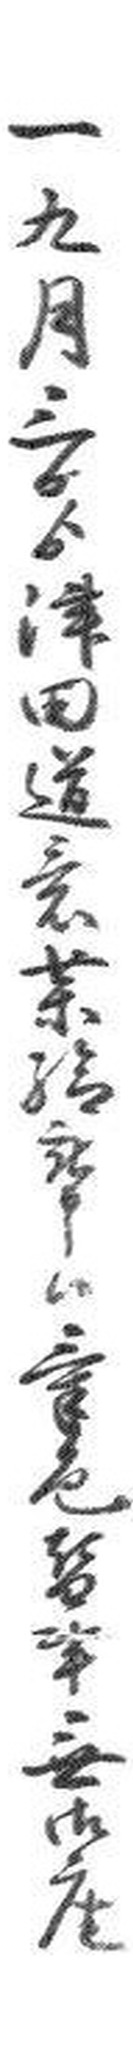一九月三日ゟ津田道意薬給被申候気色替事無御座
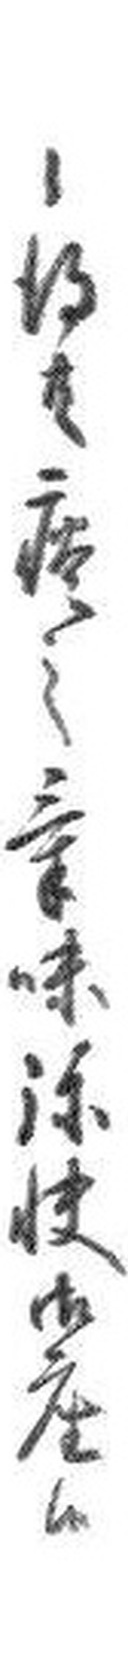候得共痰之気味弥快御座候
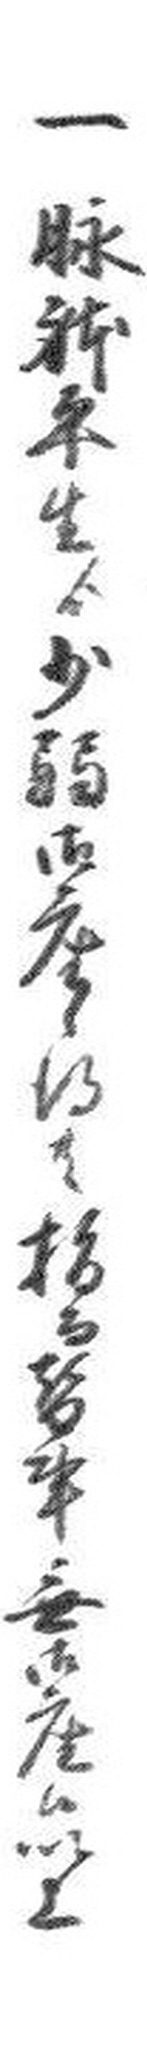一脈体平生ゟ少弱御座候得共指而替事無御座候以上
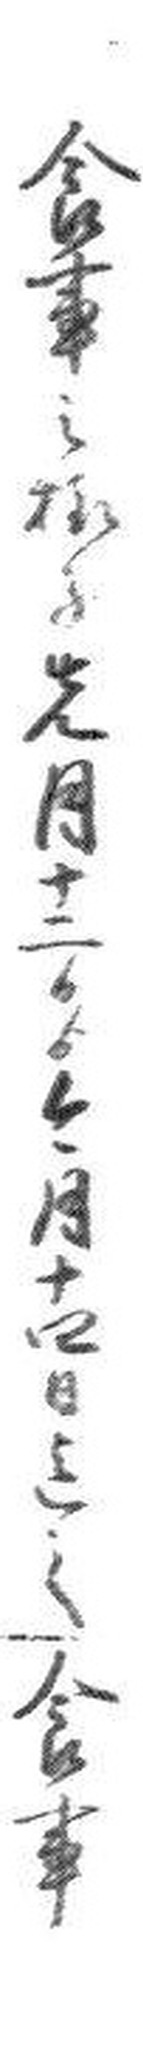食事之様子先月十二日ゟ今月十四日迄之食事
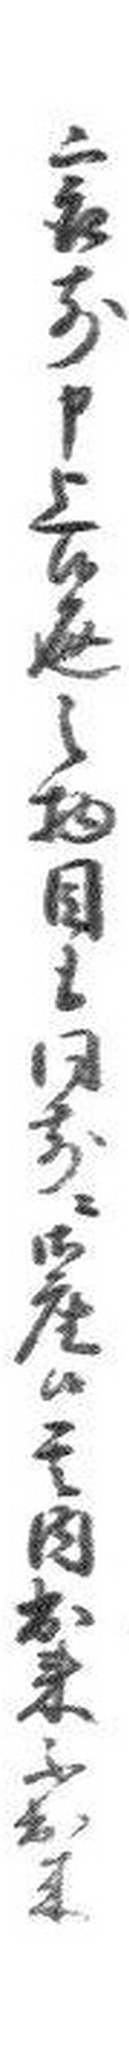最前申上候通之物目も同前ニ御座候其内出来不出来
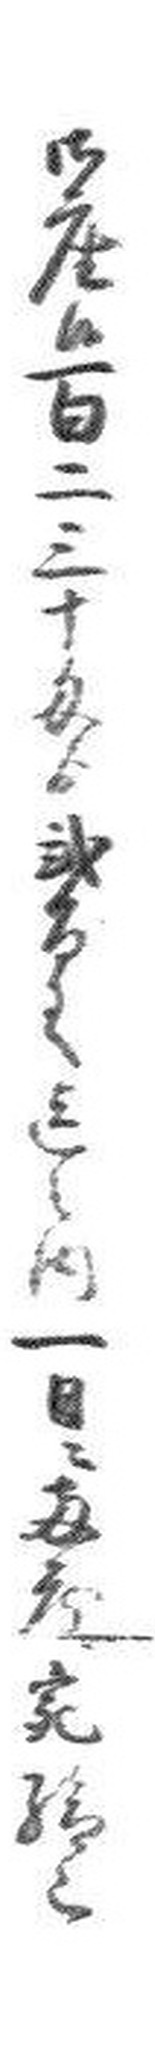御座候百二三十匁ゟ弐百匁迄之内一日ニ両度宛給之
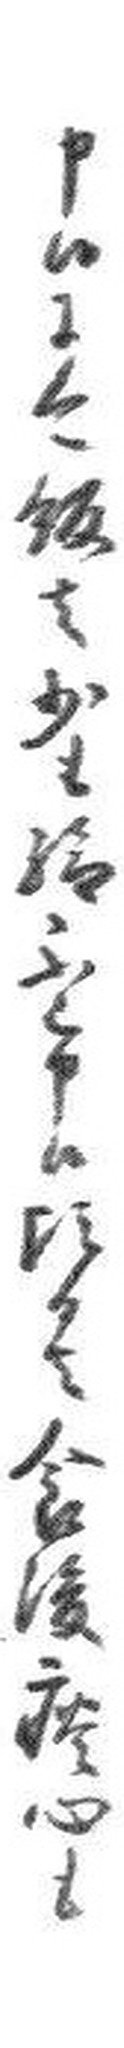申候に今飯は少も給不被申候頃日は食後痰心も
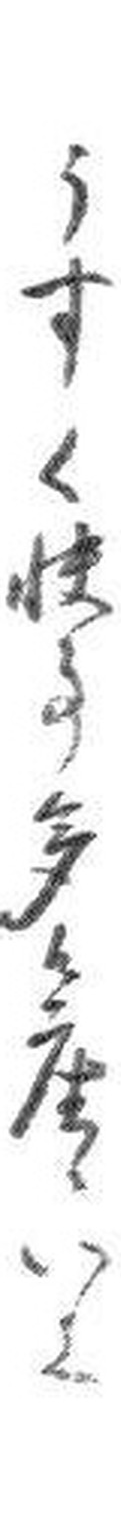うすく快事多御座候以上

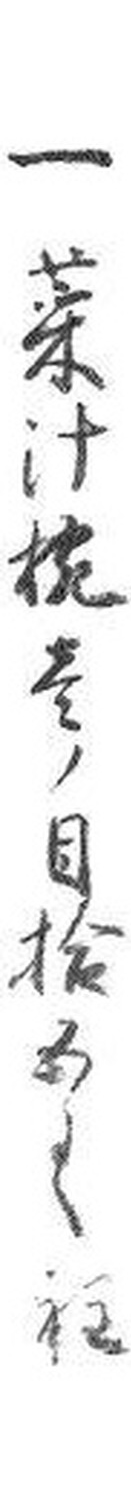一菜汁椀壱ノ目拾五匁程
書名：家譜 八 光通公 従寛文十年到同十二年
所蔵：福井県文書館 Fukui Prefectural Archives
